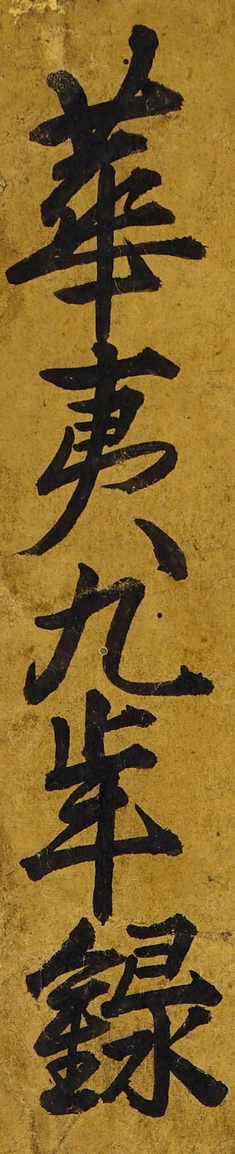華夷九歳録

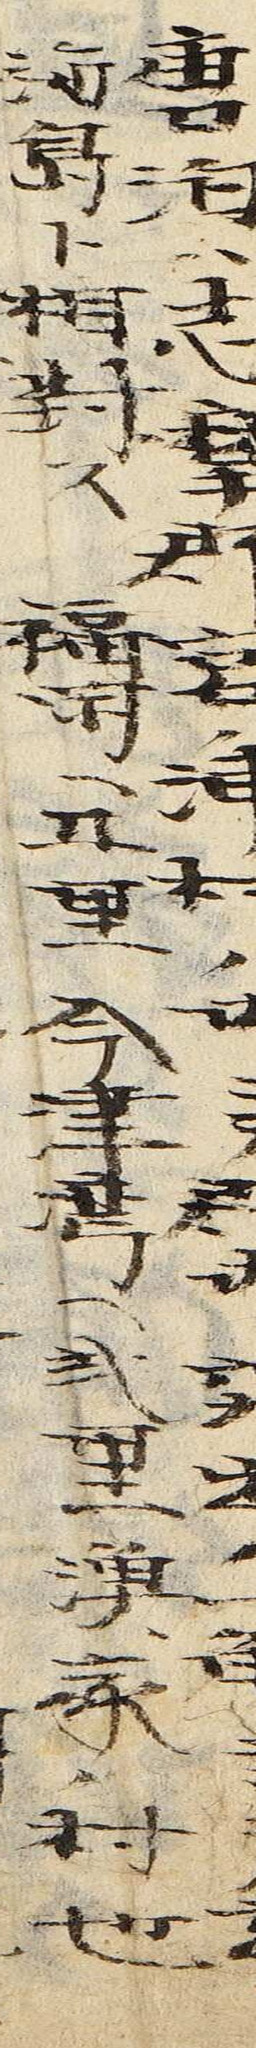海島と相対す福岡へ五里今津湾へ弐里漁家の村也
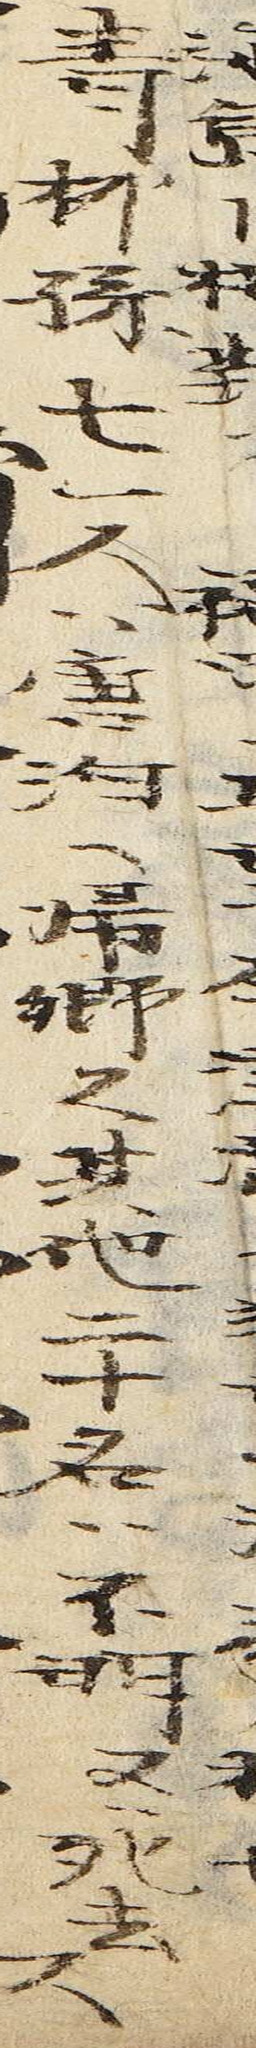青柳孫七一人は唐泊へ帰郷す其他二十名は不明又は死去す
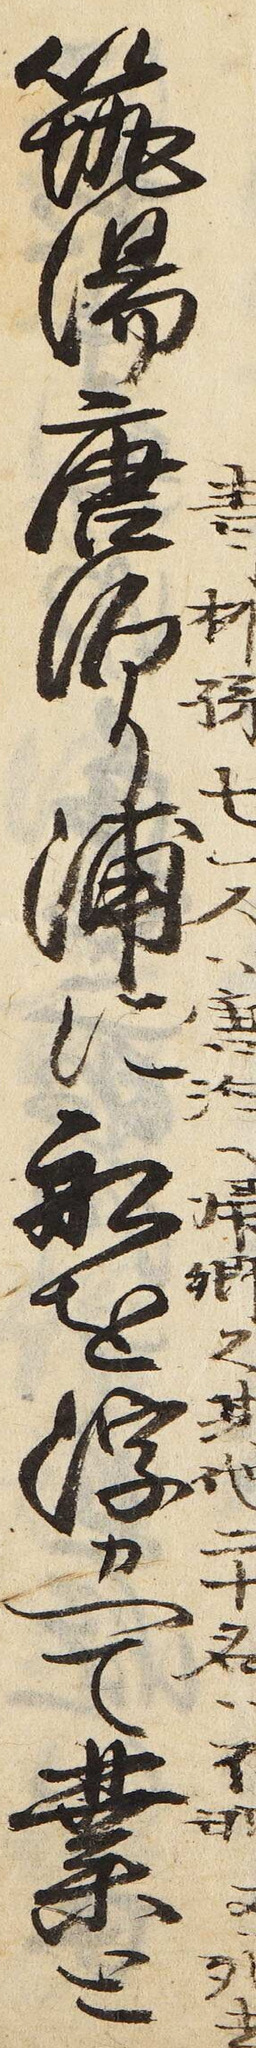筑湯唐泊り浦に船を浮かへて業と
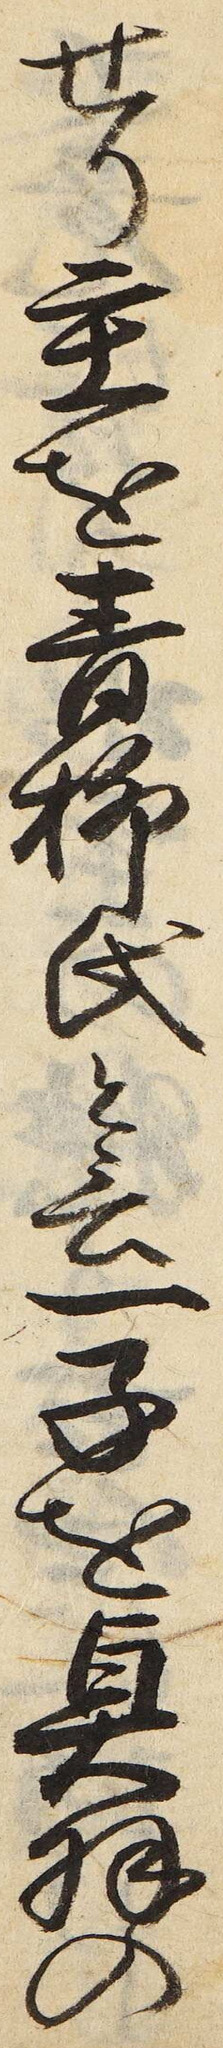せり主を青柳氏と云一子を真羽の
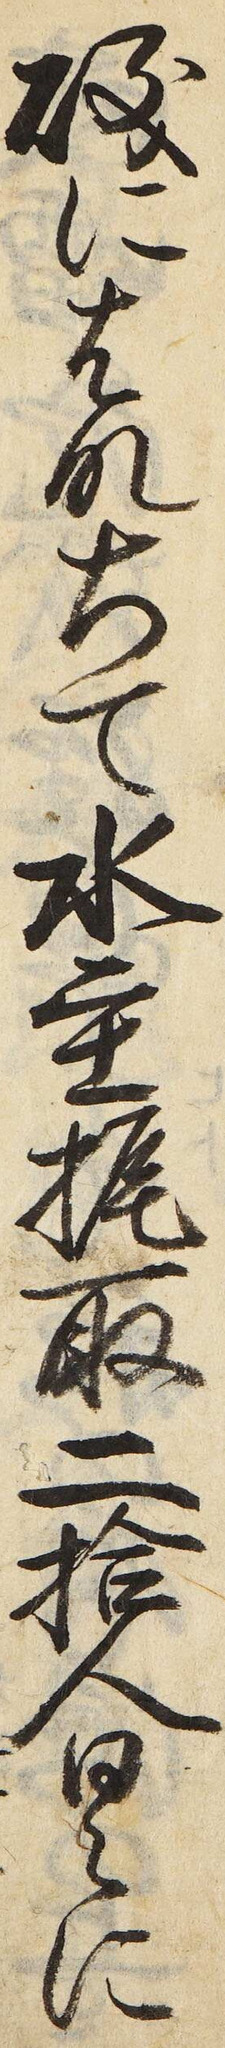磯にはなちて水主梶取二拾人日々に
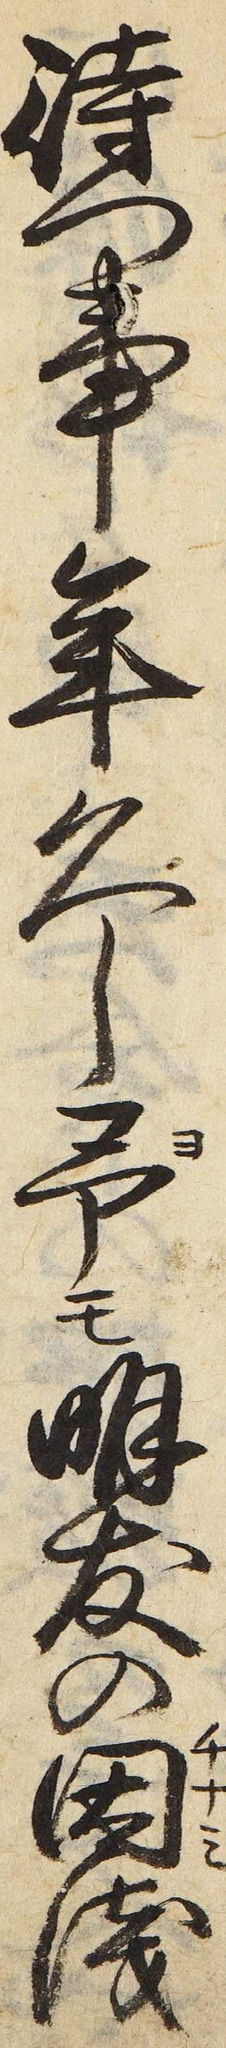待つ事年久し予も朋友の因浅
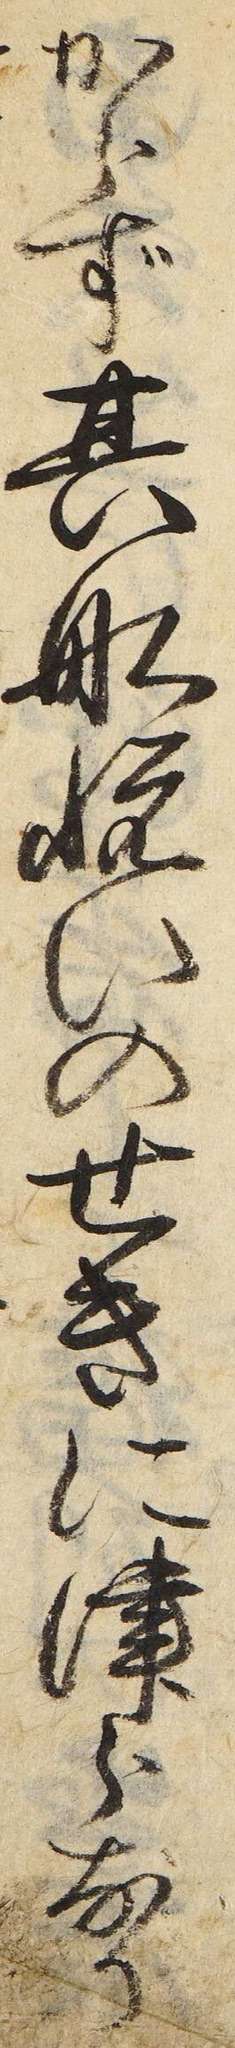からず其船祝いのせきにつらなり
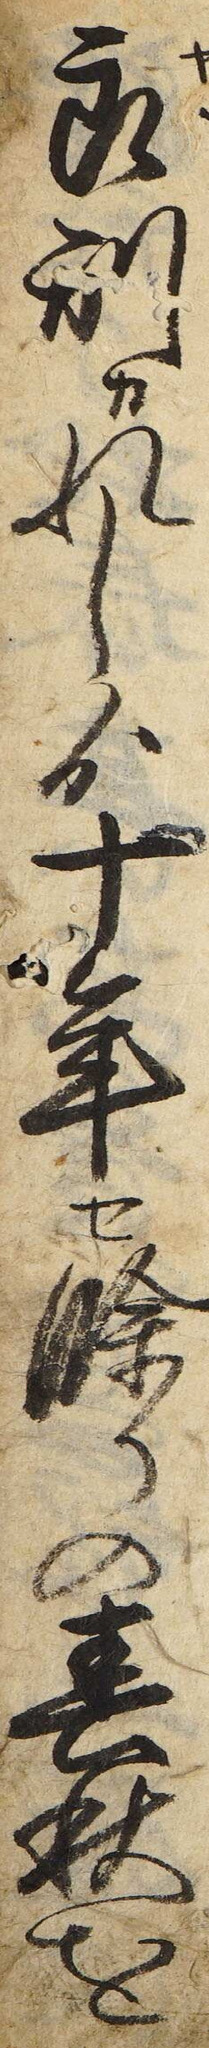良別かれしゟ十年せ余りの春秋を

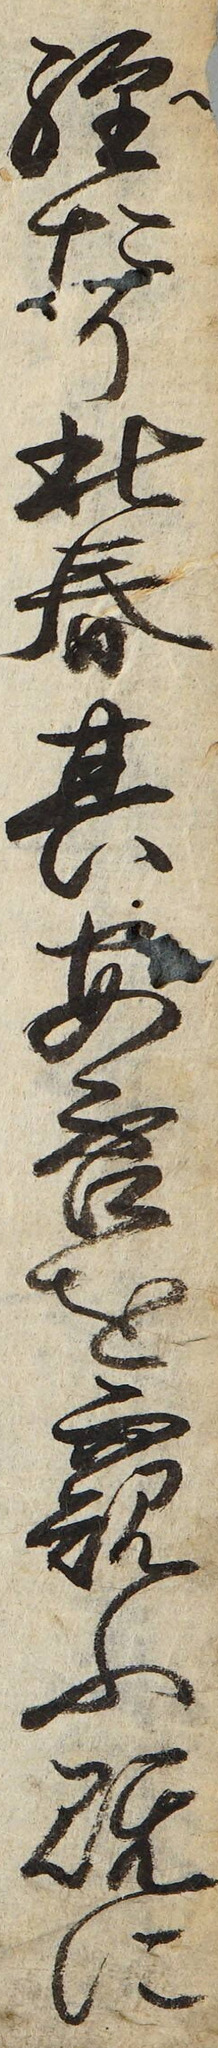経たり此春其安否を窺ふ既に
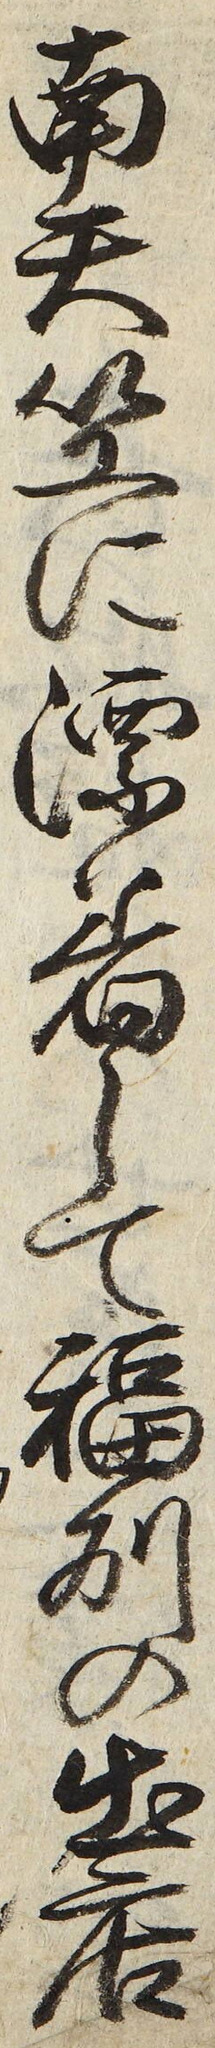南天竺に漂着して福州の出店
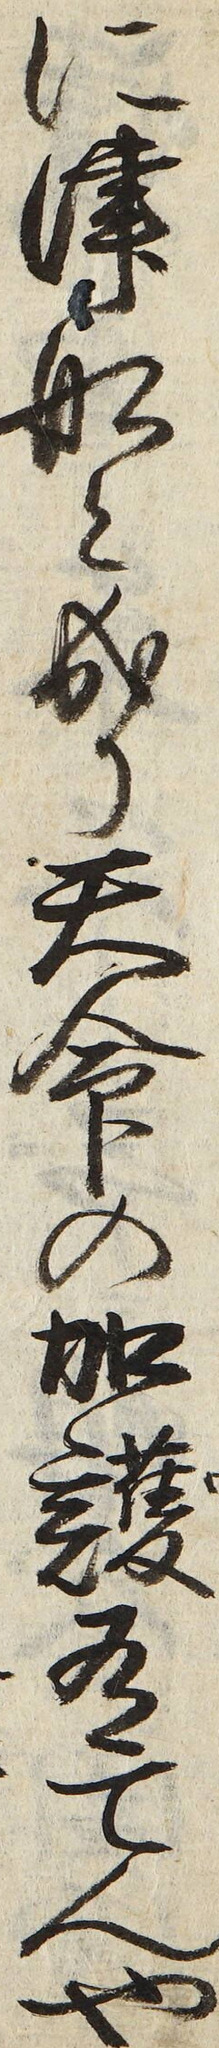に津船と成り天命の加護有てんや
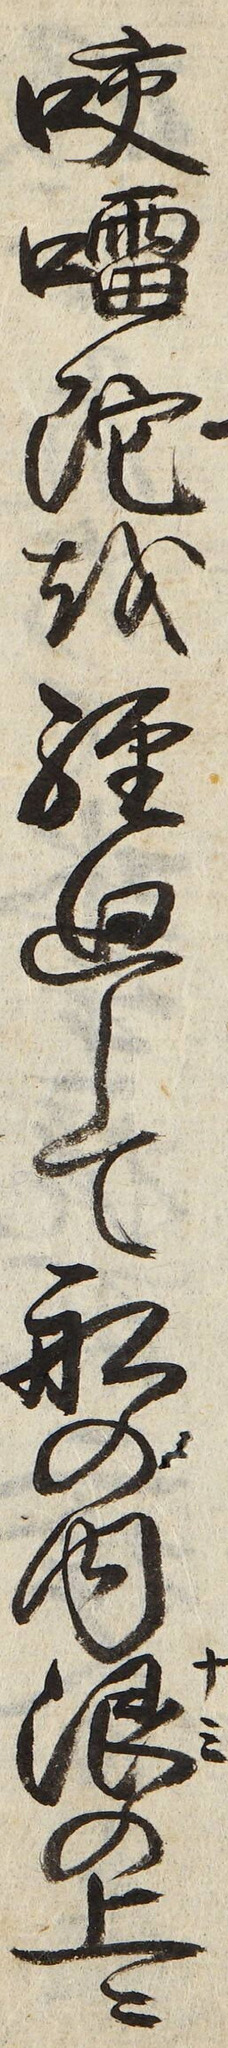咬陀を経廻して船の内浪の上に
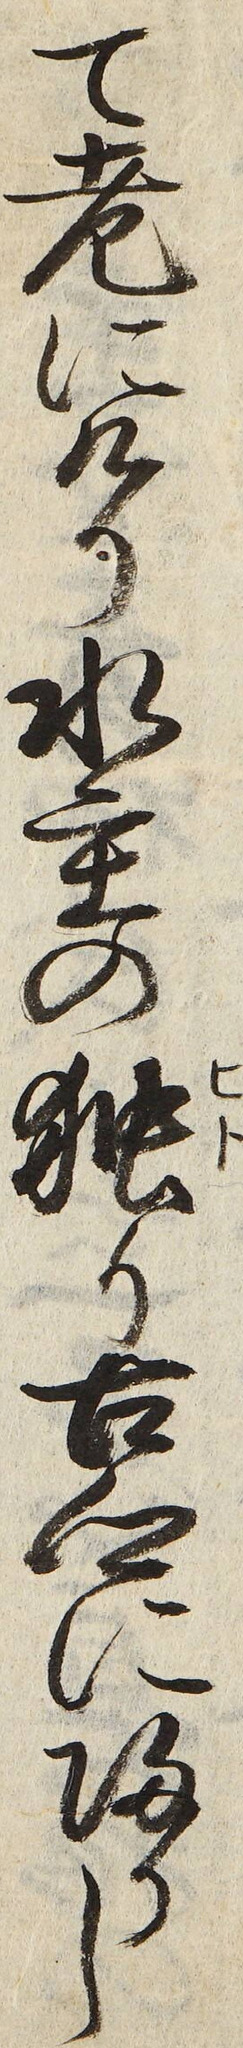て老にけり水主の独り古郷に帰りし
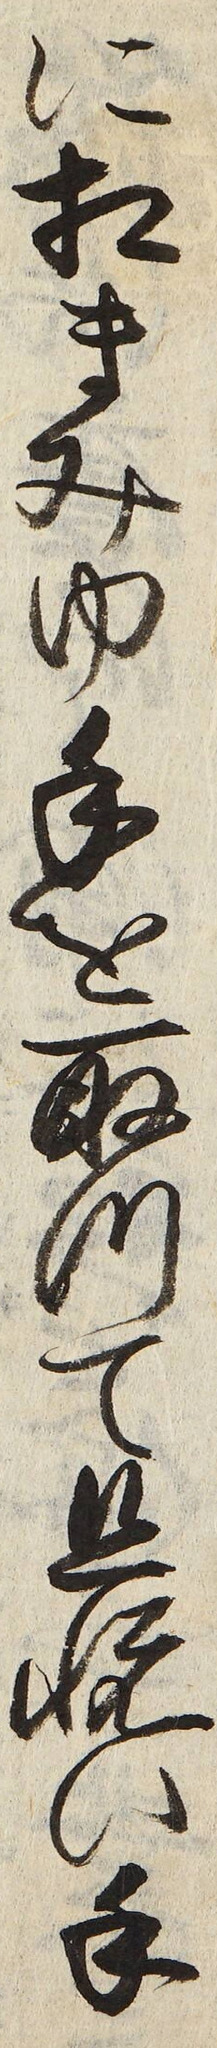に相まみゆ手を取つて且祝い手
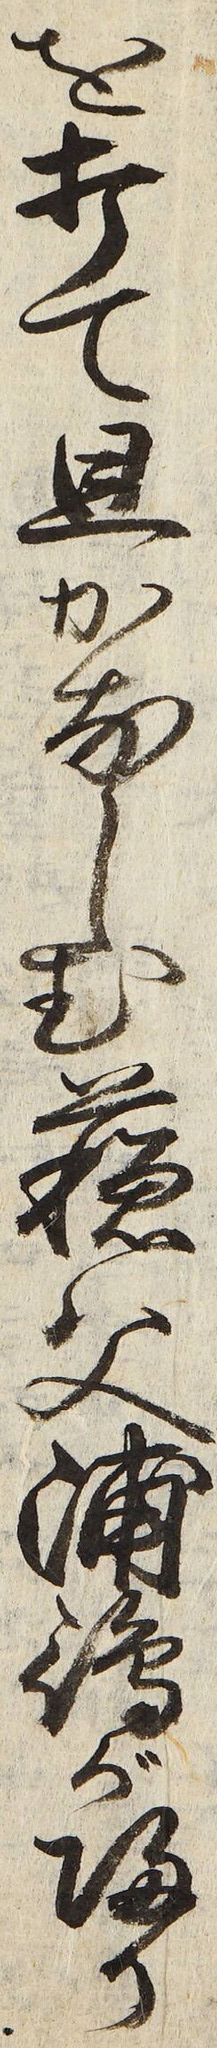を打て且かなしむ蘇父浦嶋が帰り
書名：華夷九年録
